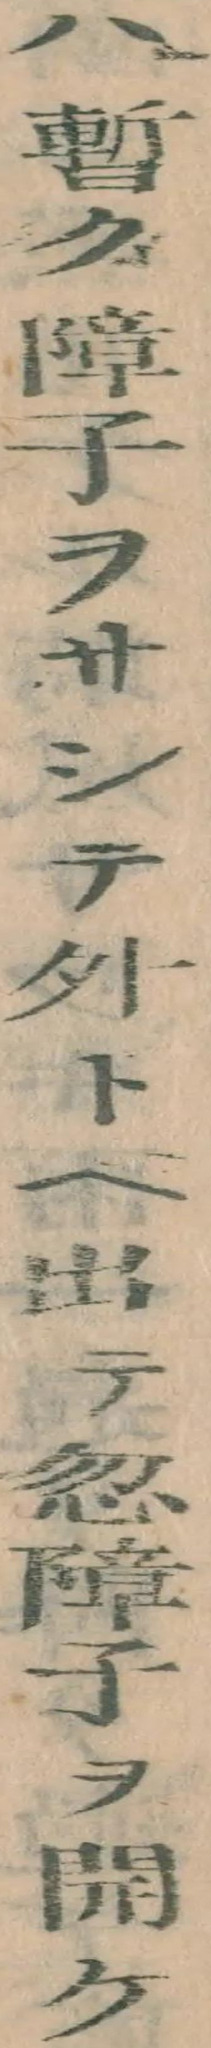ハ暫ク障子ヲサシテ外トヘ出テ忽障子ヲ開ケ
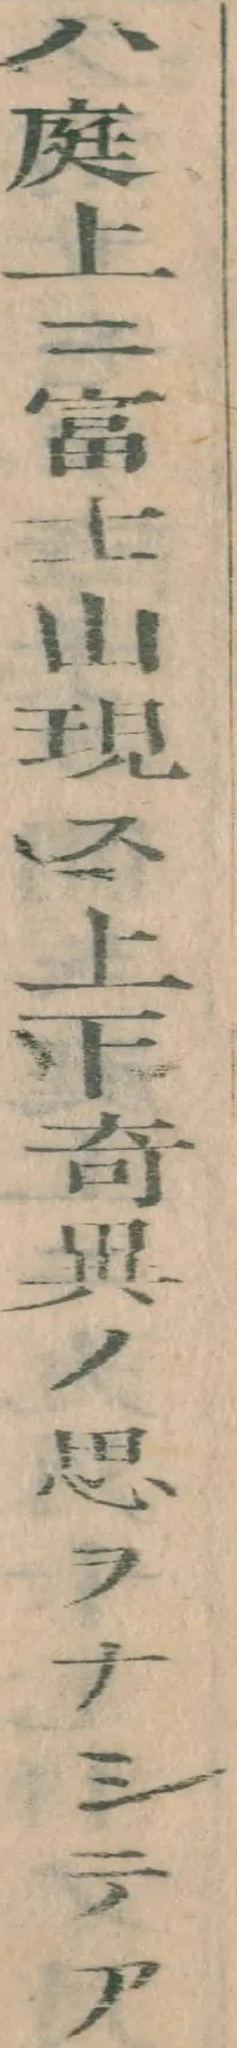ハ庭上ニ富士山現ス上下奇異ノ思ヲナシテア
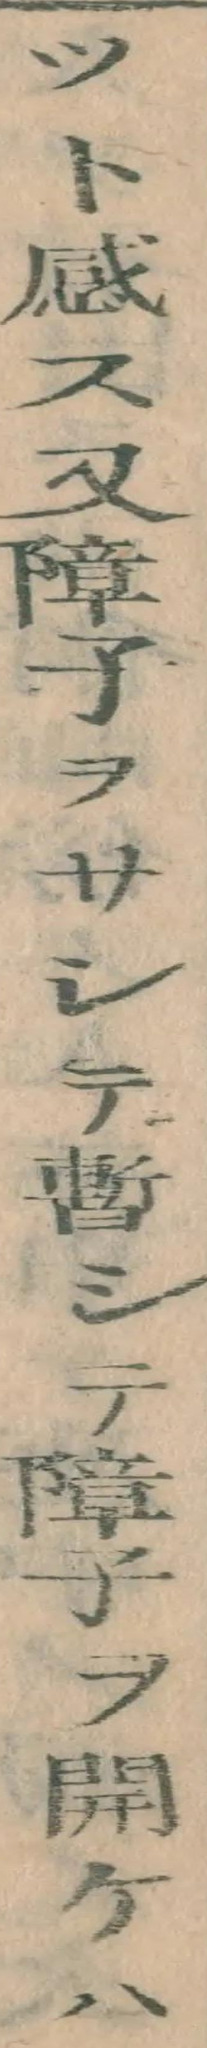ツト感ス又障子ヲサシテ暫シテ障子ヲ開ケハ
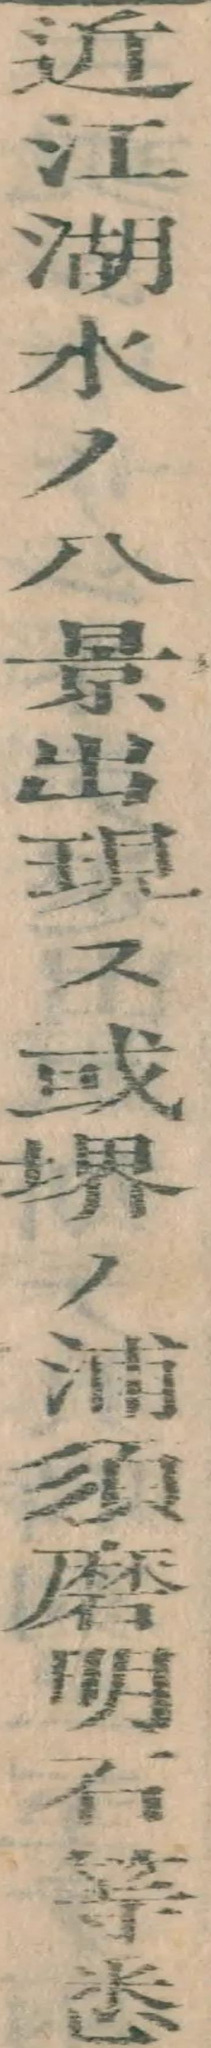近江湖水ノ八景出現ス或堺ノ浦須磨明石等悉
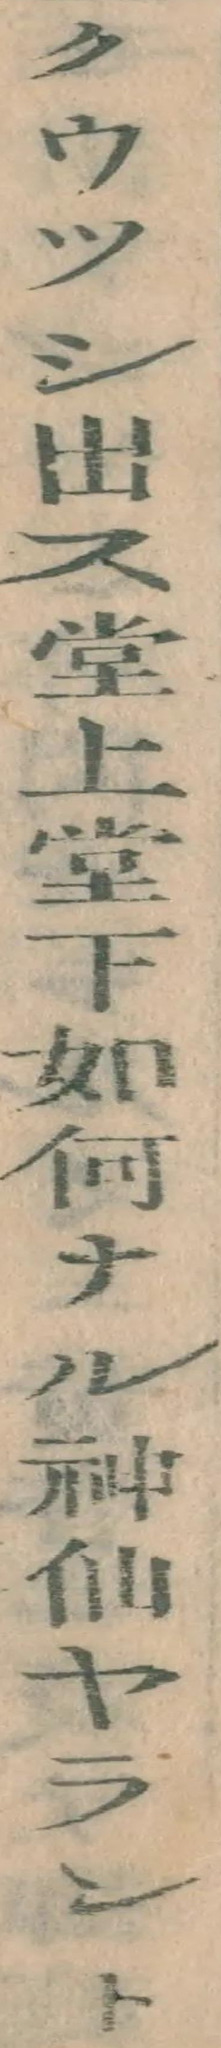クウツシ出ス堂上堂下如何ナル神仙ヤラント
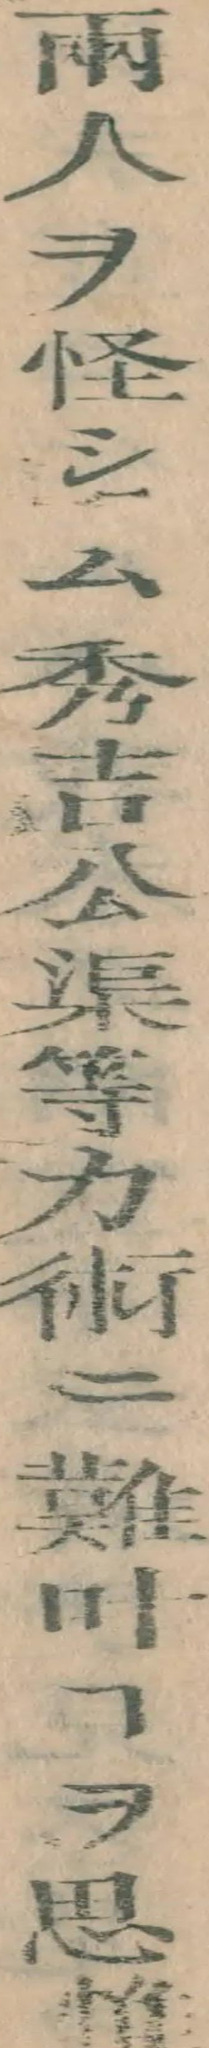両人ヲ怪シム秀吉公渠等力術ニ難叶ヿヲ思惟

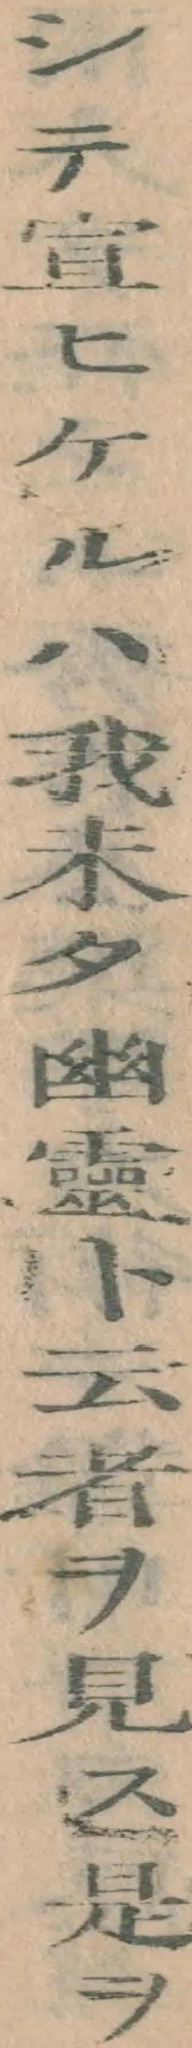シテ宣ヒケルハ我未タ幽霊ト云者ヲ見ス是ヲ
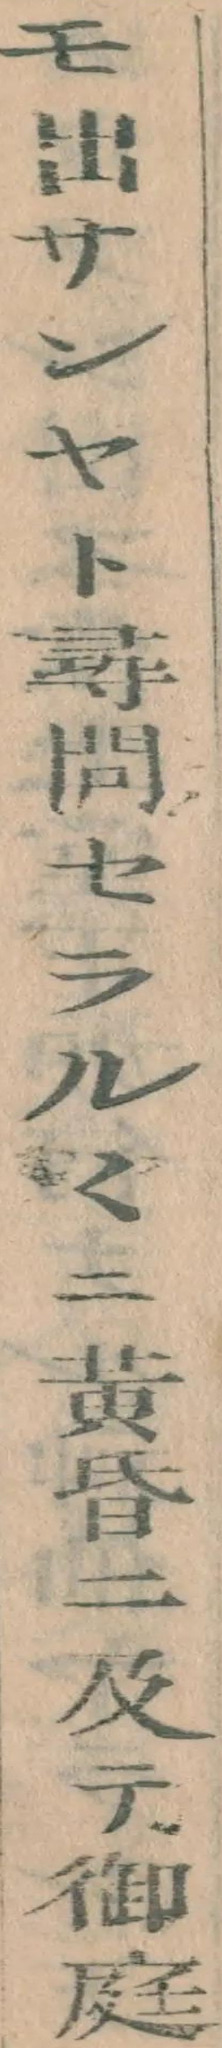モ出サンヤト尋問セラル〱ニ黄昏ニ及テ御庭
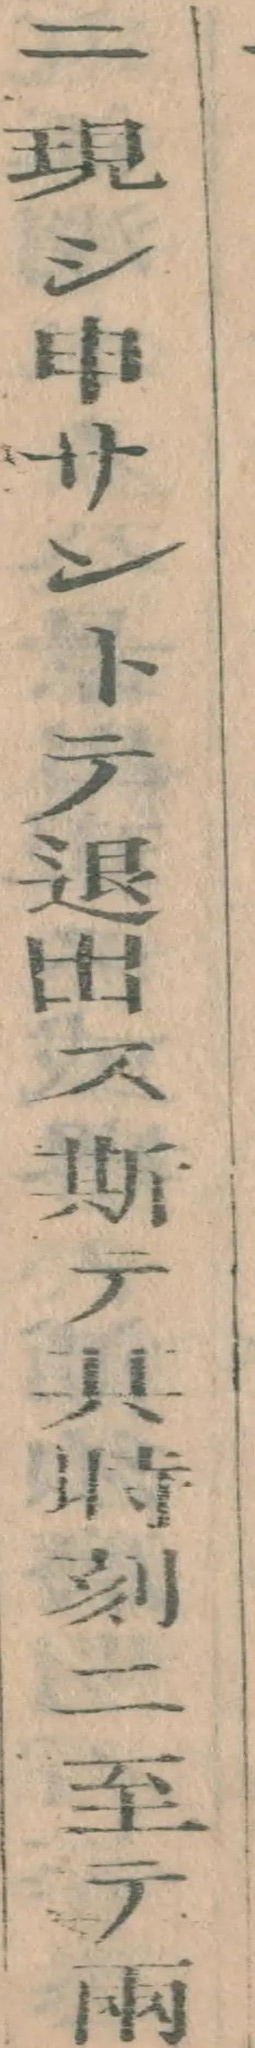ニ現シ申サントテ退出ス斯テ其時刻ニ至テ両
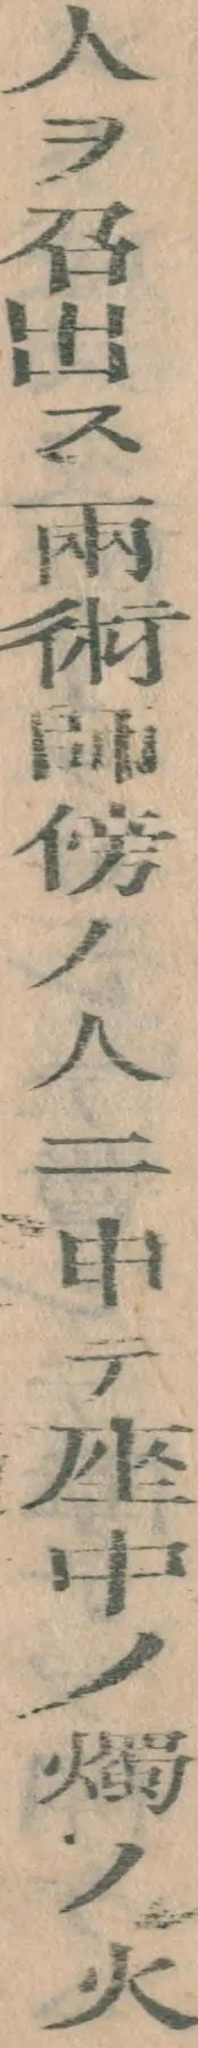人ヲ召出ス両術師傍ノ人ニ申テ座中ノ燭ノ火
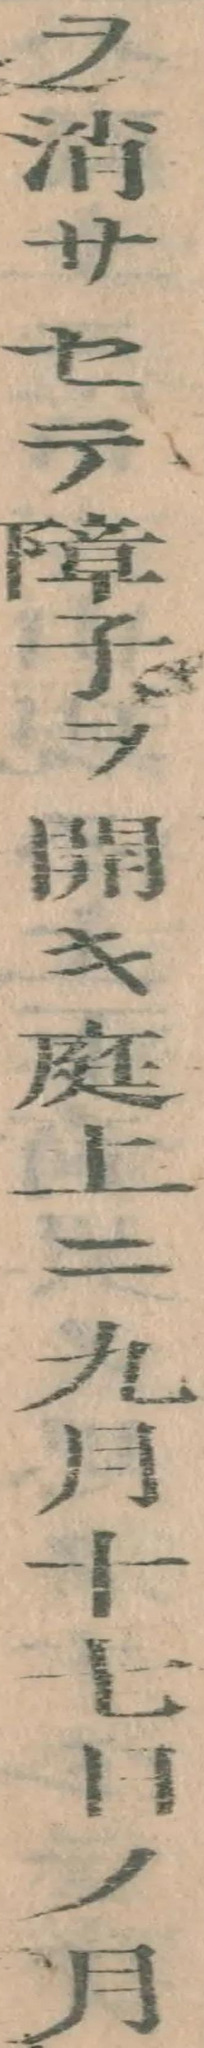ヲ消サセテ障子ヲ開キ庭上ニ九月十七日ノ月
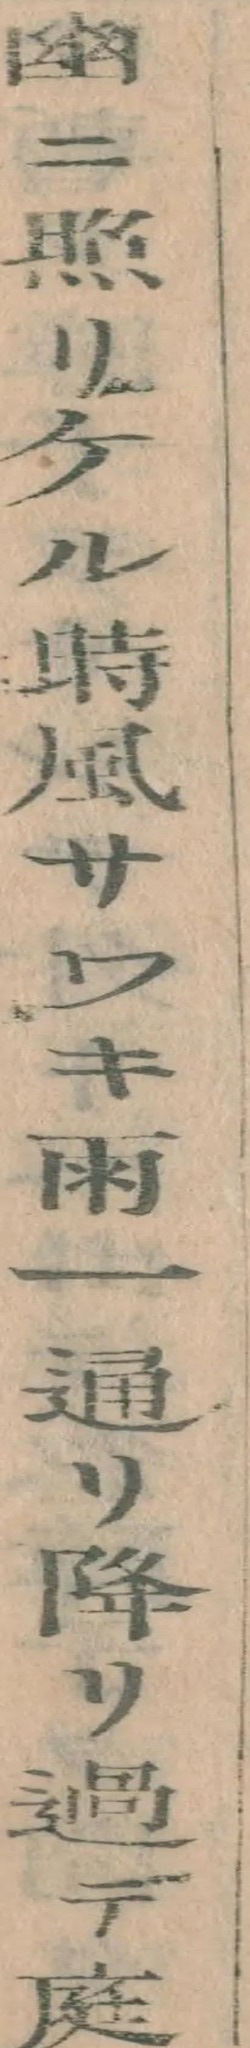幽ニ照リケル時風サワキ雨一通リ降リ過テ庭
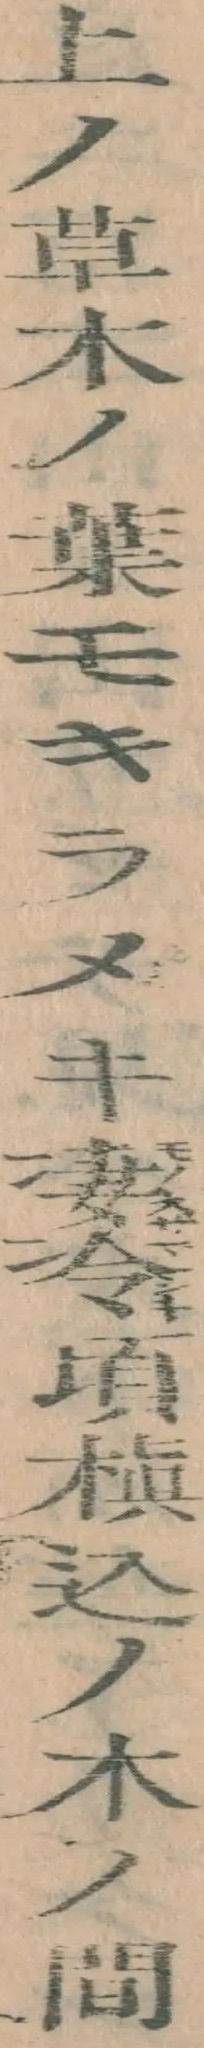上ノ草木ノ葉モキラメキ凄冷頃槙込ノ木ノ間
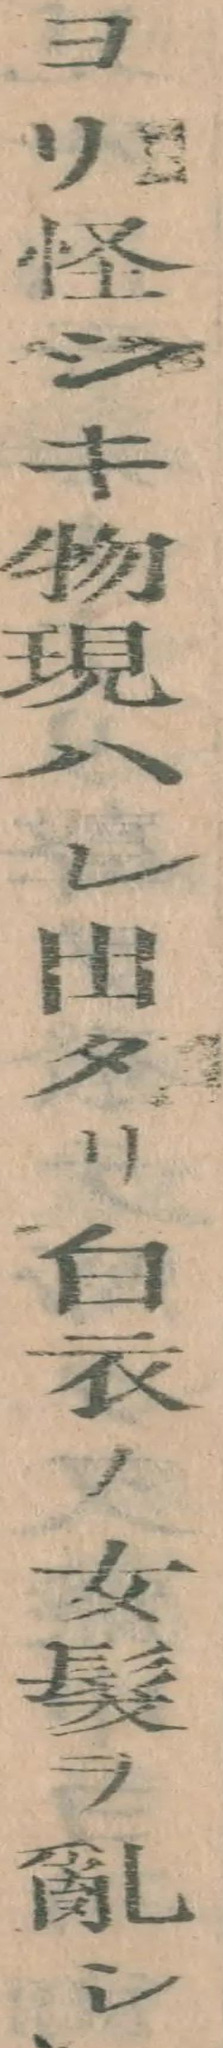ヨリ怪シキ物現ハレ出タリ白衣ノ女髪ヲ乱シ
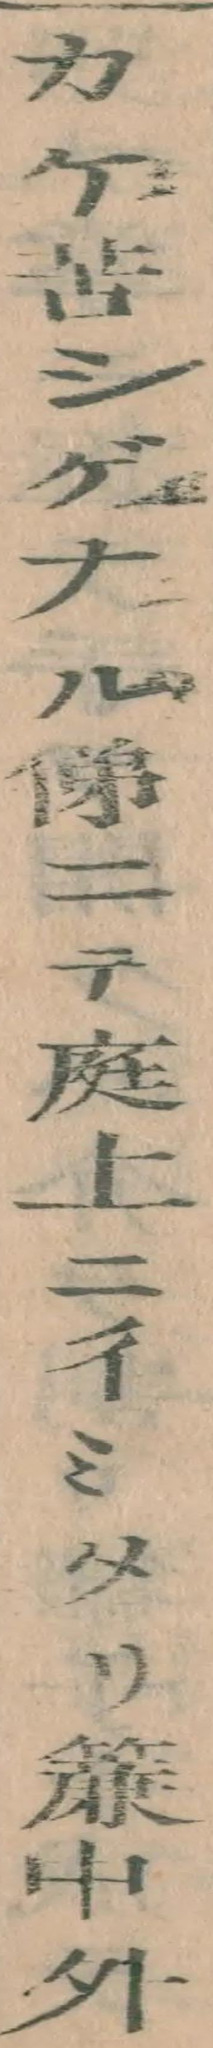カケ苦シゲナル俤ニテ庭上ニ彳ミタリ簾中外
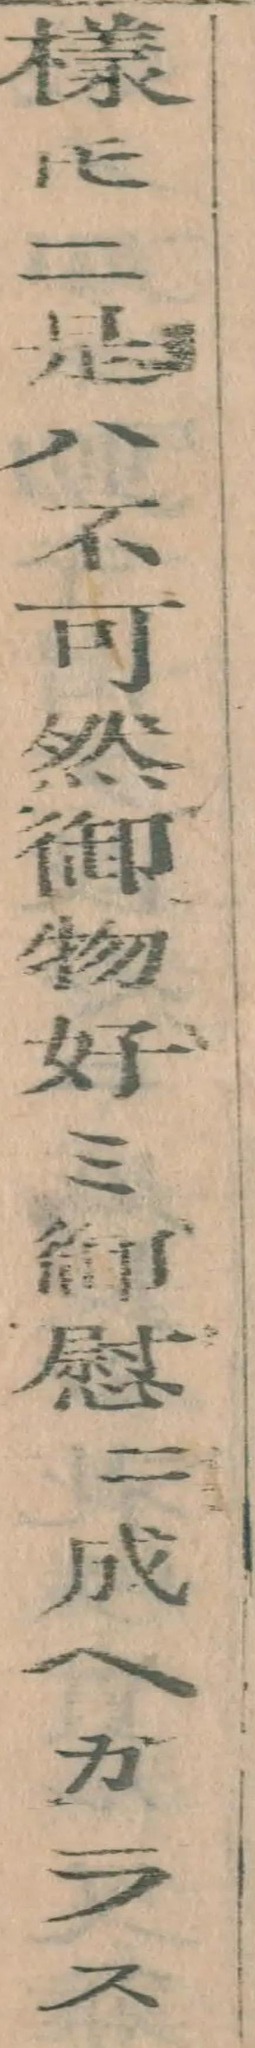様トモニ是ハ不可然御物好ミ御慰ニ成ヘカラス
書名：南蛮寺興廃記
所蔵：国立国会図書館 National Diet Library, JAPAN
